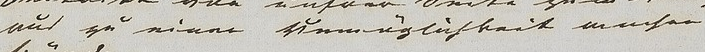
aus zu einer Unmöglichkeit machen
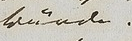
würde.
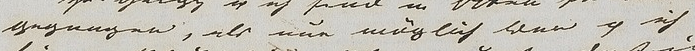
gegangen, als nur möglich war & ich
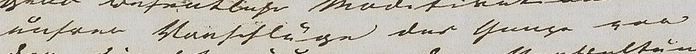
unsrer Vorschläge das Ganze von
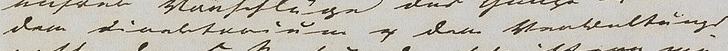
dem Direktorium & dem Verwaltungs-
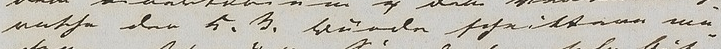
rathe der C.B. würde scheittern ma-
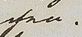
chen.
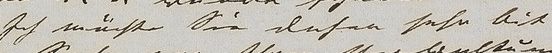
Ich möchte Sie daher sehr bit-
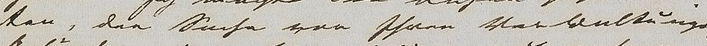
ten, der Sache von Ihrer Verwaltungs-
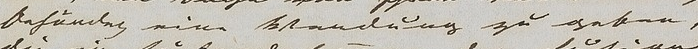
behörde eine Wendung zu geben,
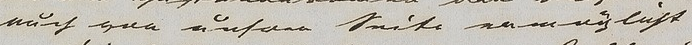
auch von unsrer Seite ermöglicht.
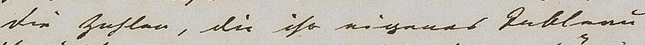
Die Zahlen, die ihr eigenes Tableau
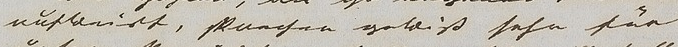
aufweist, sprechen gewiß sehr für
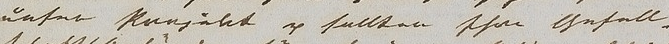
unser Projekt & sollten Ihre Gesell-
